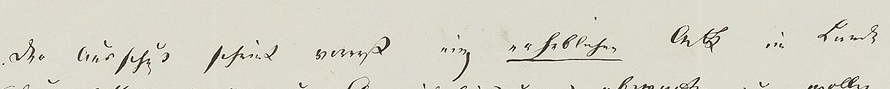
Der Ausschuß scheint vorerst einen erheblichenAckt im Lande
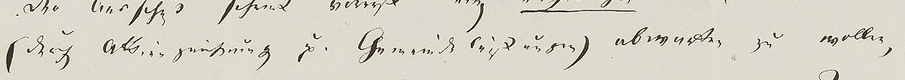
(durch Aktienzeichnungen &. Gemeindeleistungen) abwarten zu wollen,
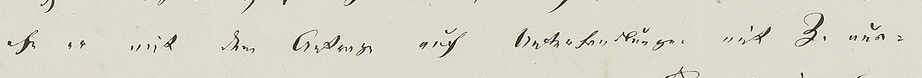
ehe er mit dem Antrage auf Unterhandlungen mit Z. aus-
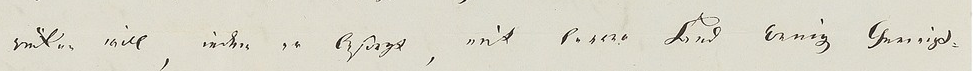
rücken will, indem er besorgt, mit leerer Hand wenig Geneigt-
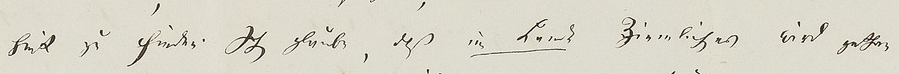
heit zu finden. Ich glaube, daß im Lande Ziemliches wird gethan
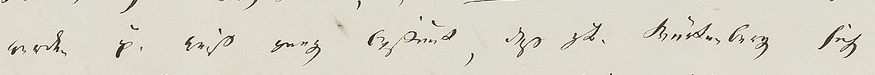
werden &. weiß ganz bestimmt, daß z. B. Würtenberg sich
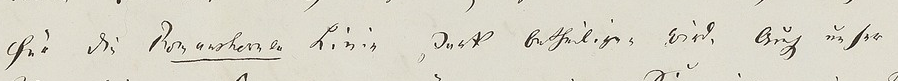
für die Romanshorner Linie stark betheiligen wird. Auch unser
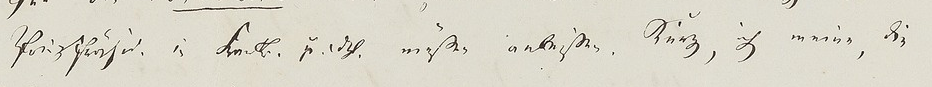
Prinzpräsid. in Frankr &.dgl. müßen anbeißen. Kurz, ich meine die
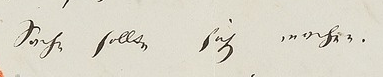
Sache sollte sich machen.
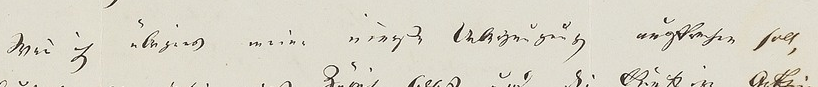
Wenn ich übrigens meine innerste Ueberzeugung aussprechen soll,
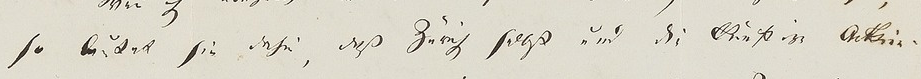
so lautet sie dahin, daß Zürich selbst und die künftige Acktien-
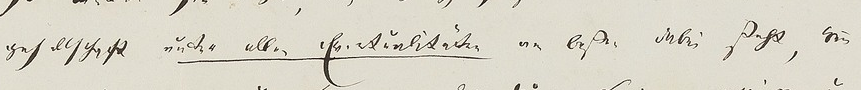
gesellschaft unter allen Eventualitäten am besten dabei steht, wenn
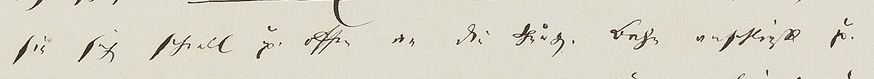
sie sich schnell &. offen an die thurg. Bahn anschließt &.
